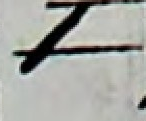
I
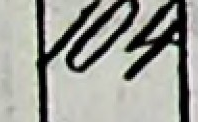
104
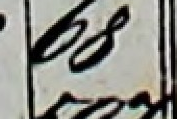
68
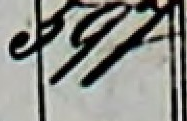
597
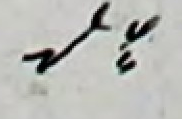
do
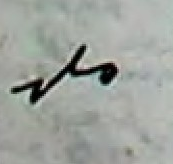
do
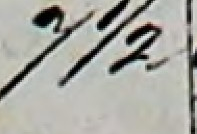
7 ½
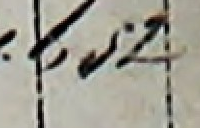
1,52
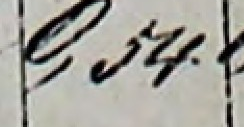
0,54
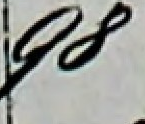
98
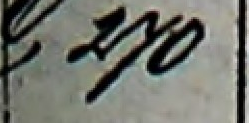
0,270
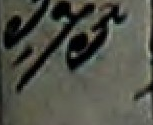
3,75
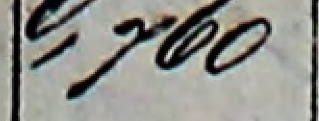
0,760
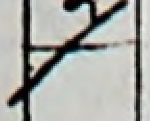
7
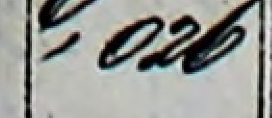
0,026
